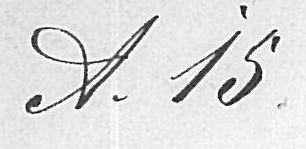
A. 15.
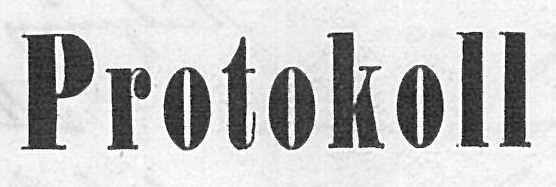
Protokoll
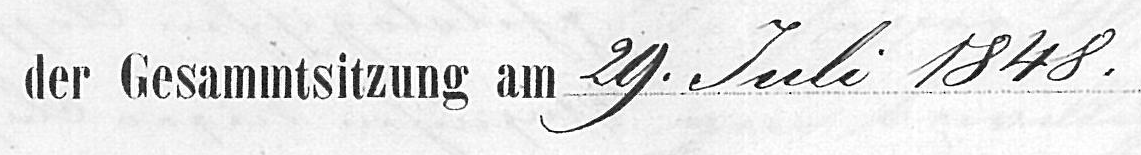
der Gesammtsitzung am 29. Juli 1848.
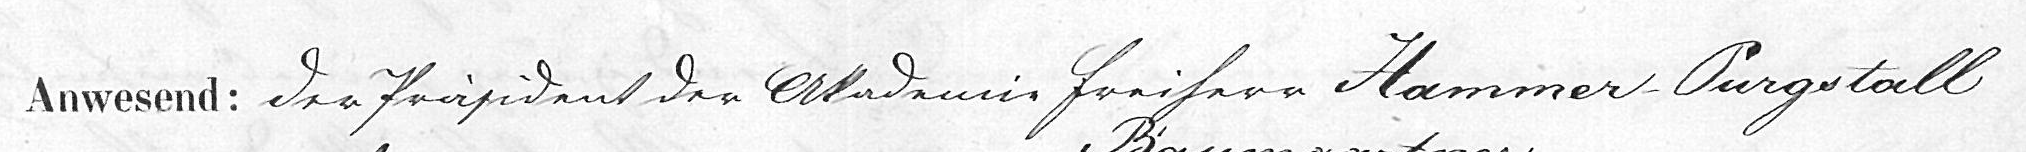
Anwesende: der Präsident der Akademie Freiherr Hammer-Purgstall
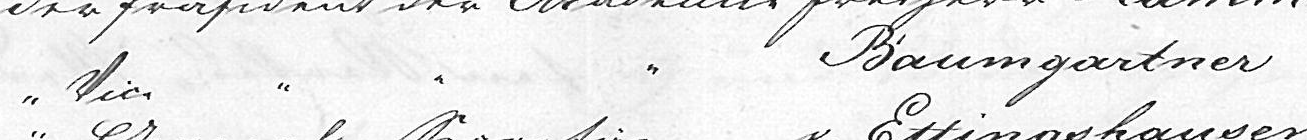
" Vice " " " Baumgartner
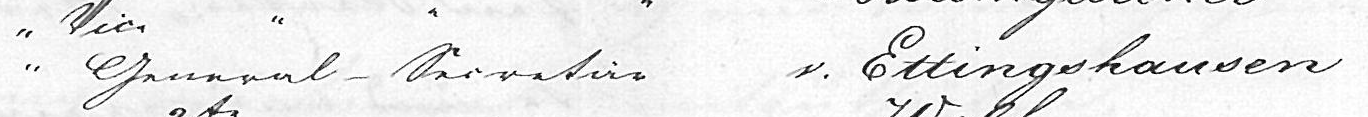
" General-Secretär " Ettingshausen
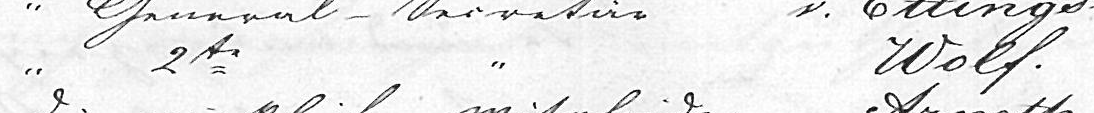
" 2te " " Wolf
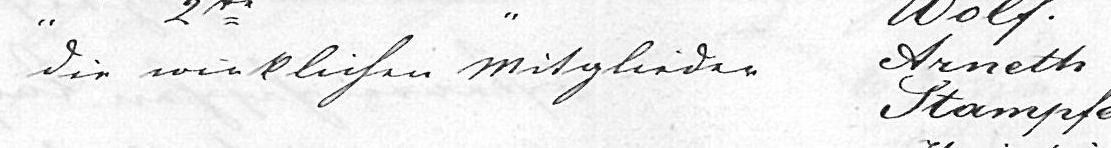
die wirklichen Mitglieder Arneth
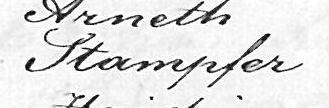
Stampfer
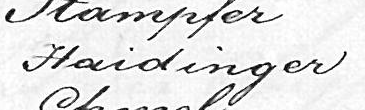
Haidinger
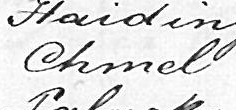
Chmel
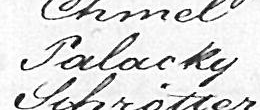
Palacky
